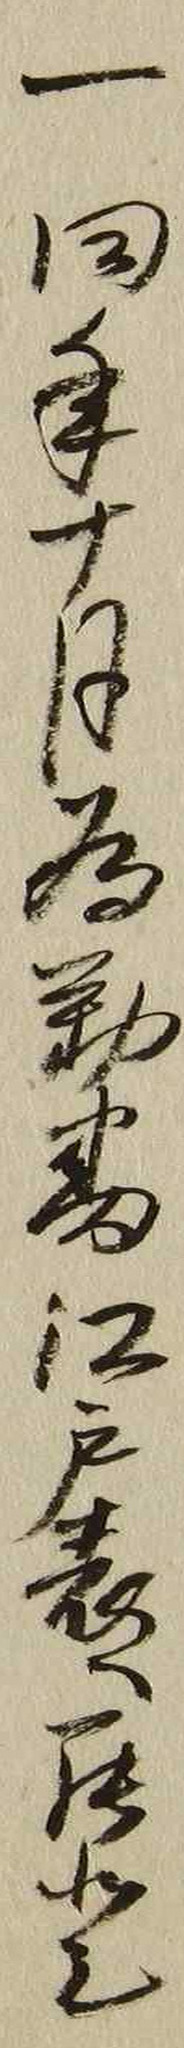一同年十月為勤番江戸表へ罷登
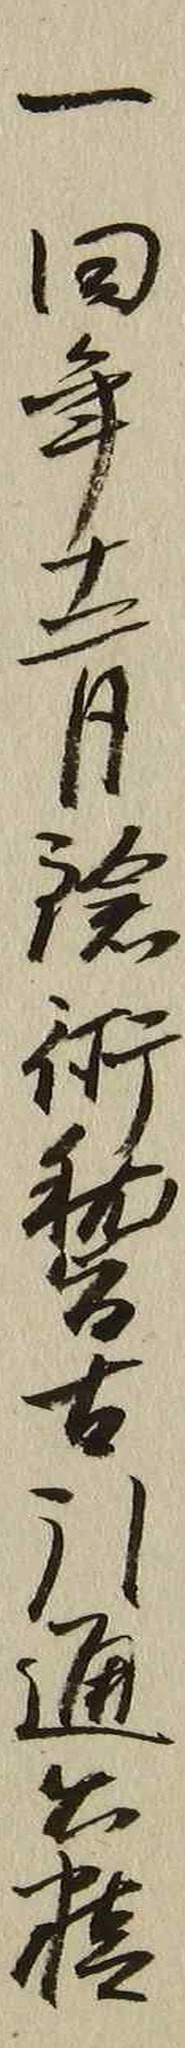一同年十二月鎗術稽古引通出精
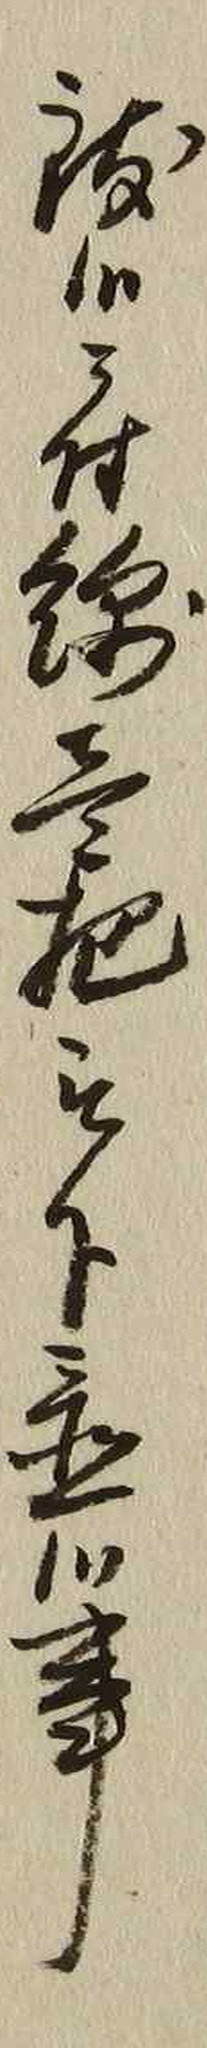致候ニ付綿壱把被下置候事
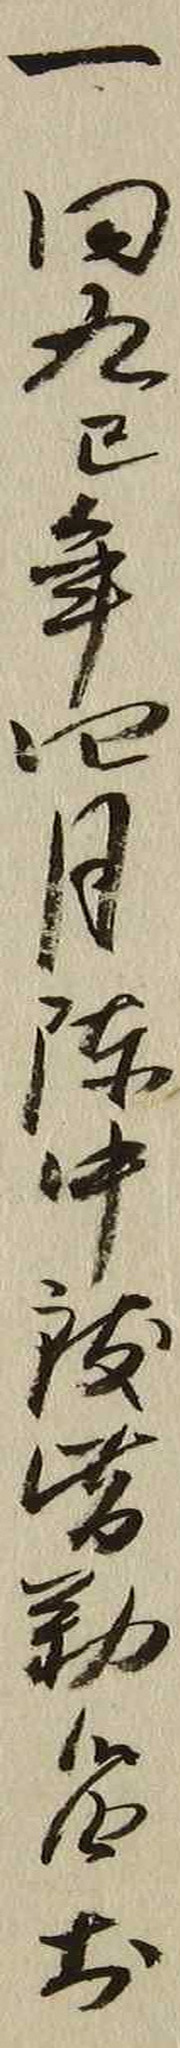一同九巳年四月陣中致皆勤候由於
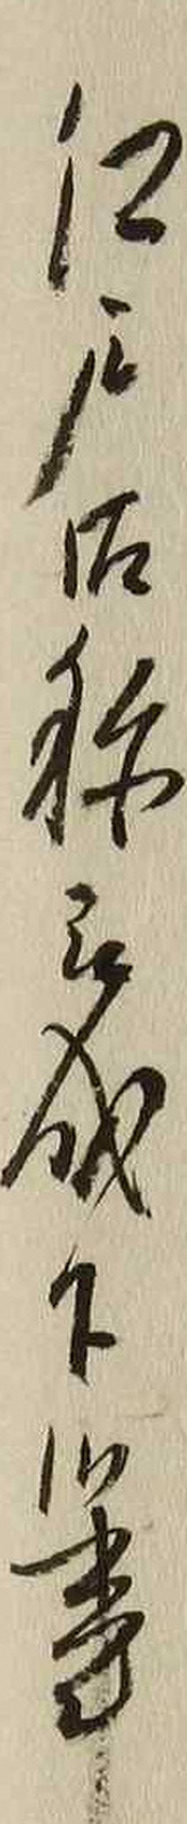江戸御称被成下候事
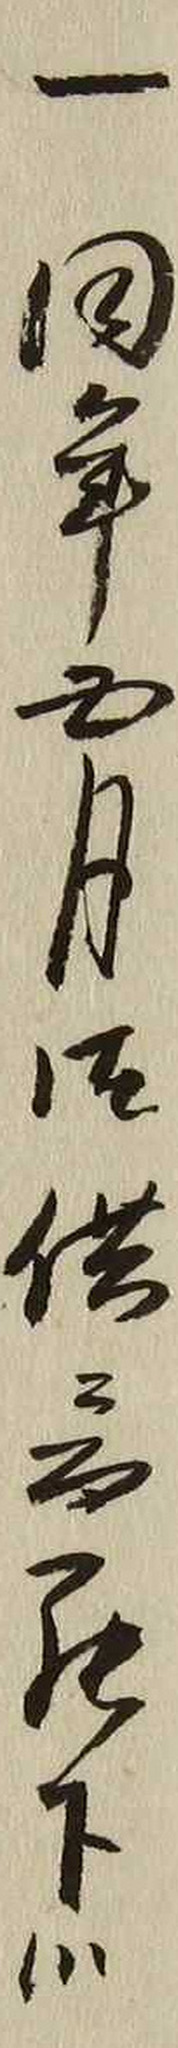一同年五月御供ニ而罷下候
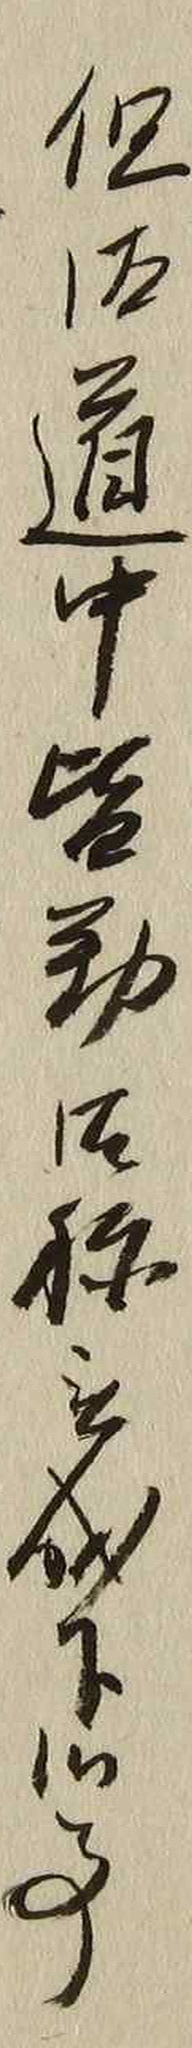但御道中皆勤御称被成下候事
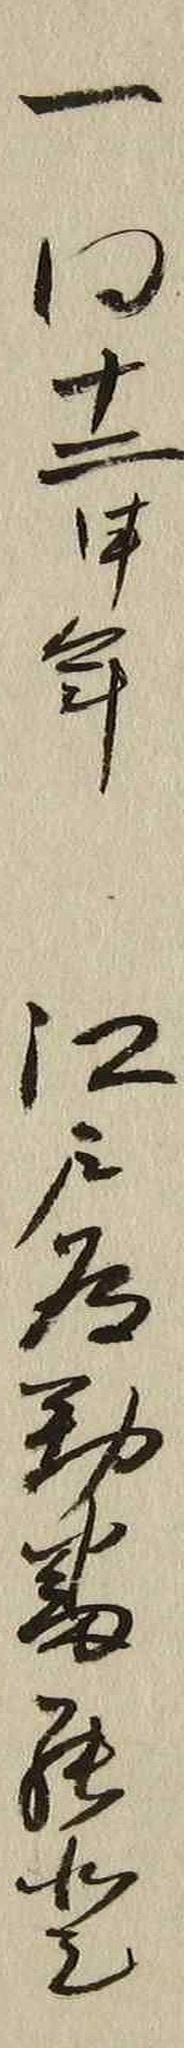一同十二申年江戸為勤番罷登
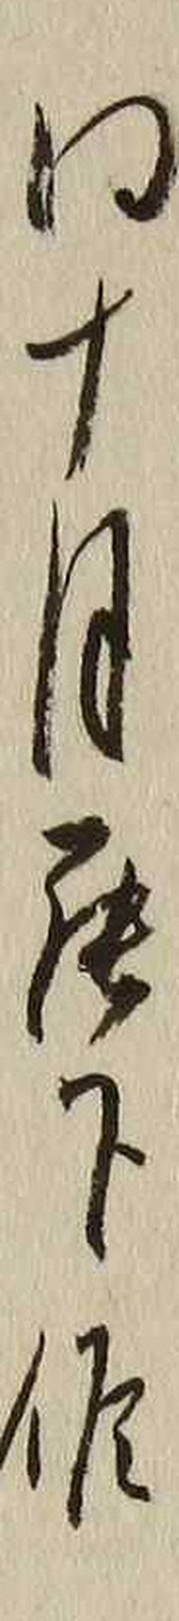同十月罷下候
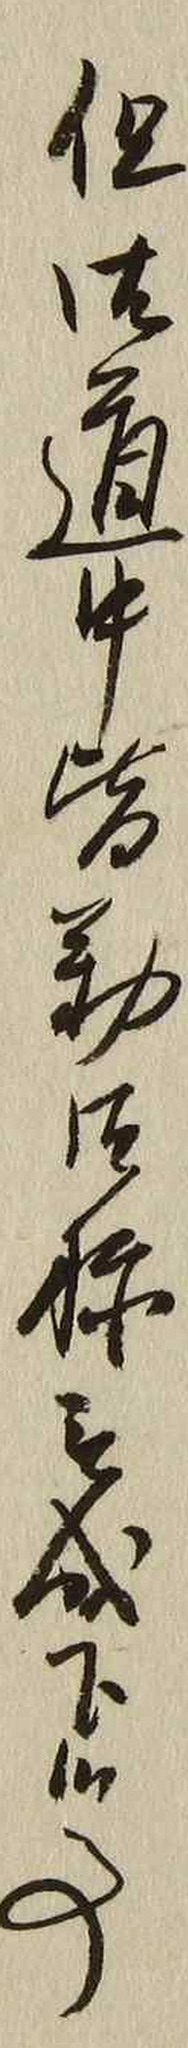但御道中皆勤御称被成下候事
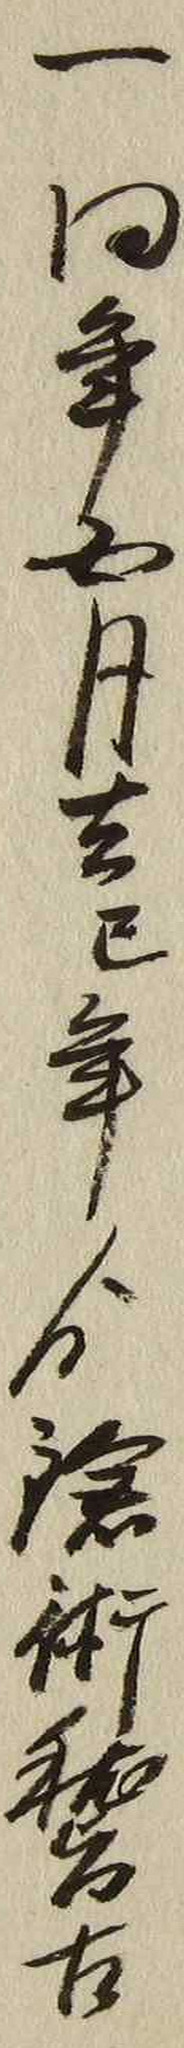一同年五月去巳年ゟ鎗術稽古
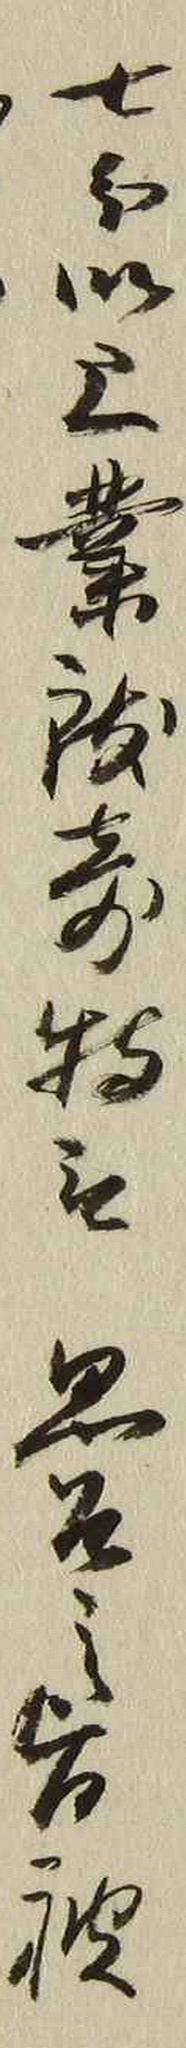七分以上業致奇特被思召之旨被
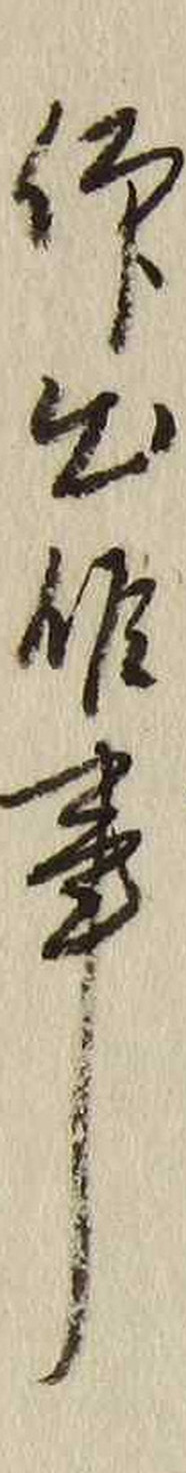仰出候事
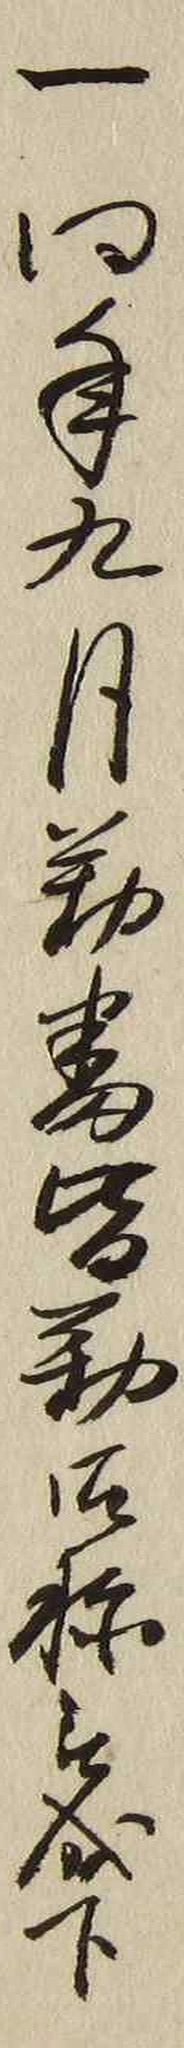一同年九月勤番皆勤御称被成下

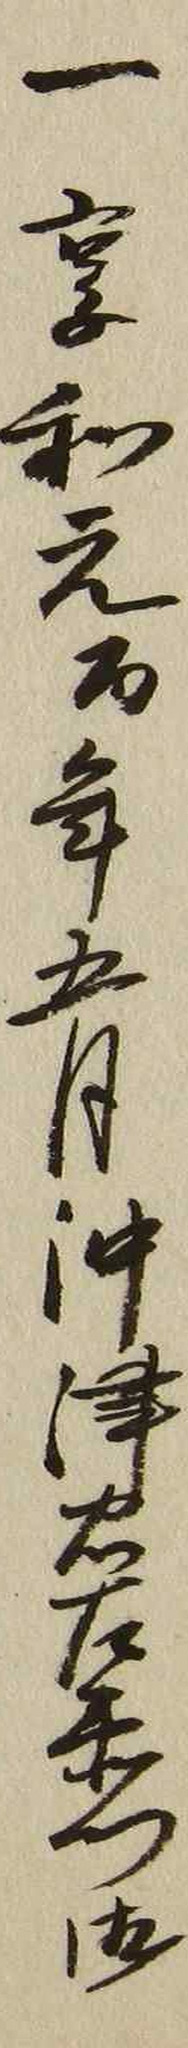一享和元酉年五月沖津忠左衛門御
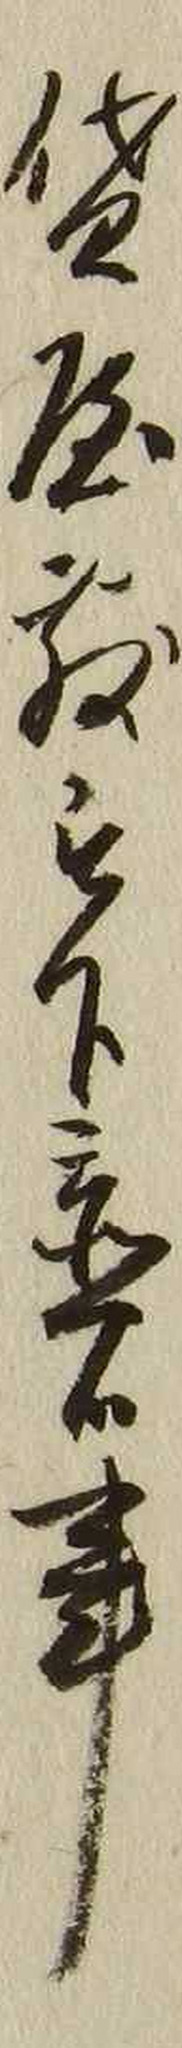貸屋敷被下置候事
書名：諸士系譜　巻之346　も之部2
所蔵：会津若松市立会津図書館
